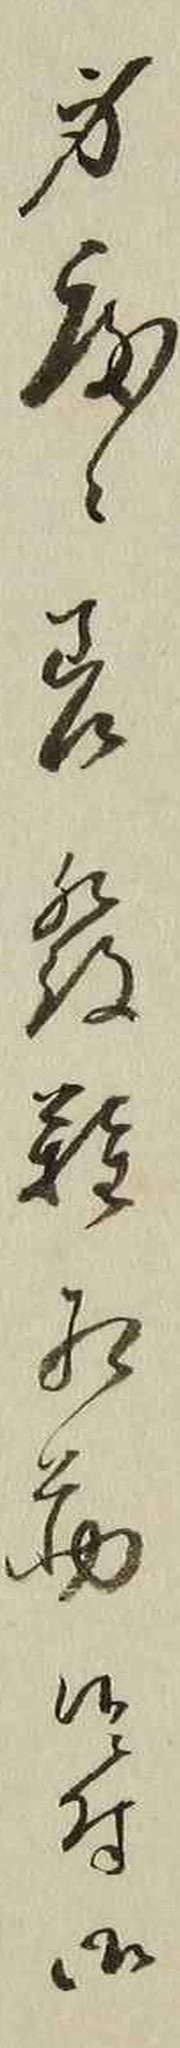身度々差発難相勤候ニ付御
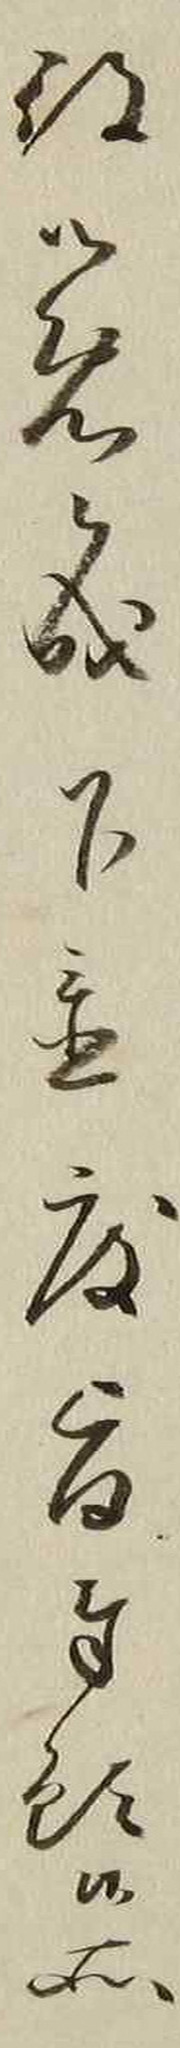役御免ニ成下置度旨奉願候所
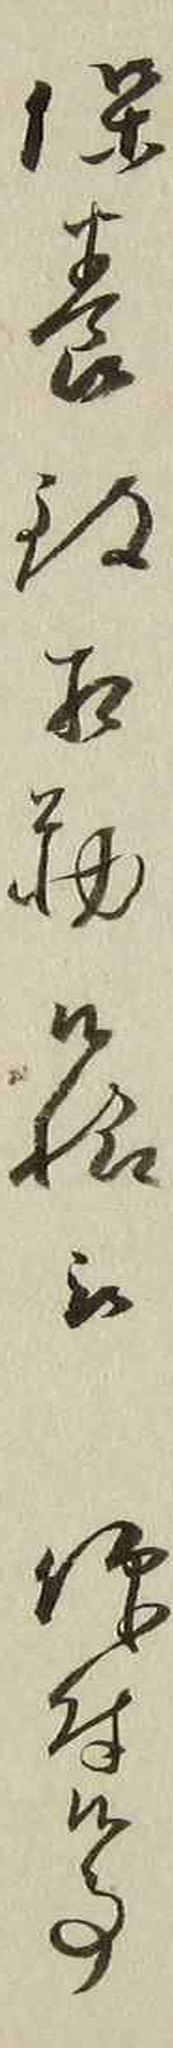保養致相勤候様被仰付候事
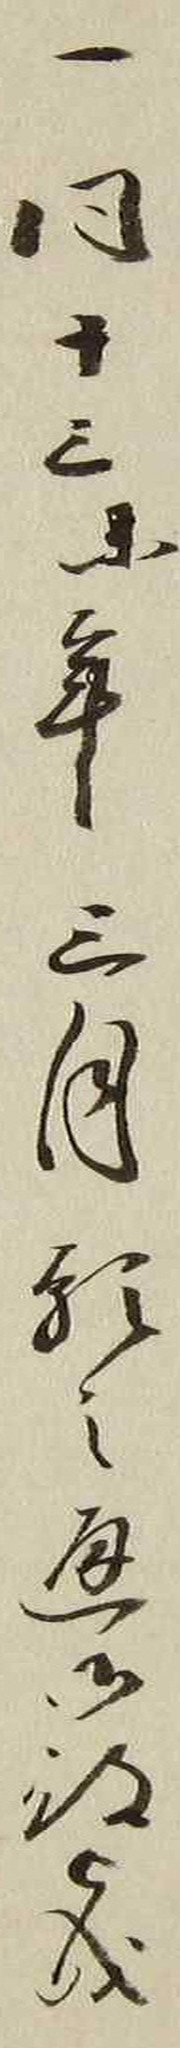一同十三未年三月願之通御役被成
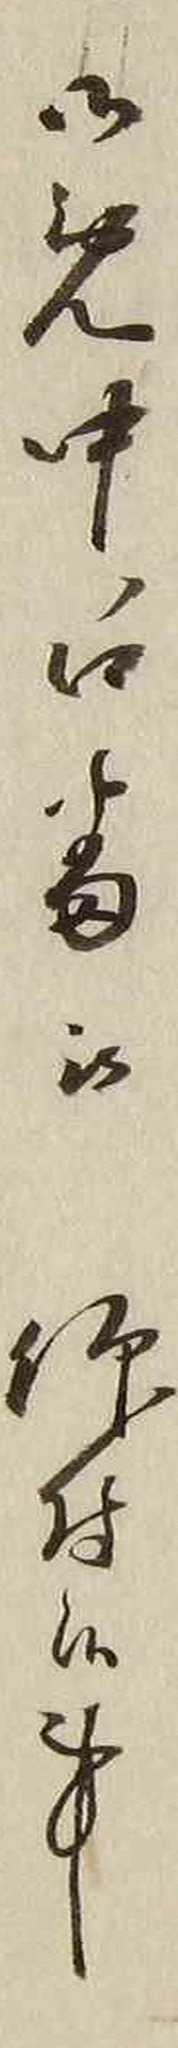御免中ノ口番被仰付候事
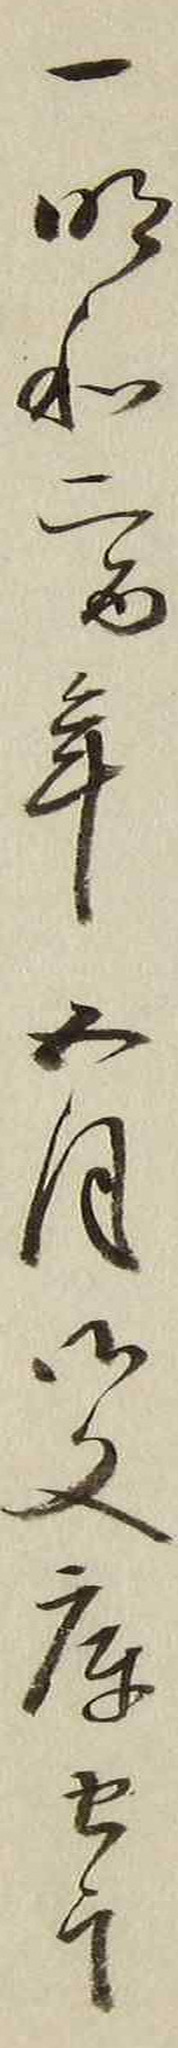一明和二酉年五月御文庫虫干
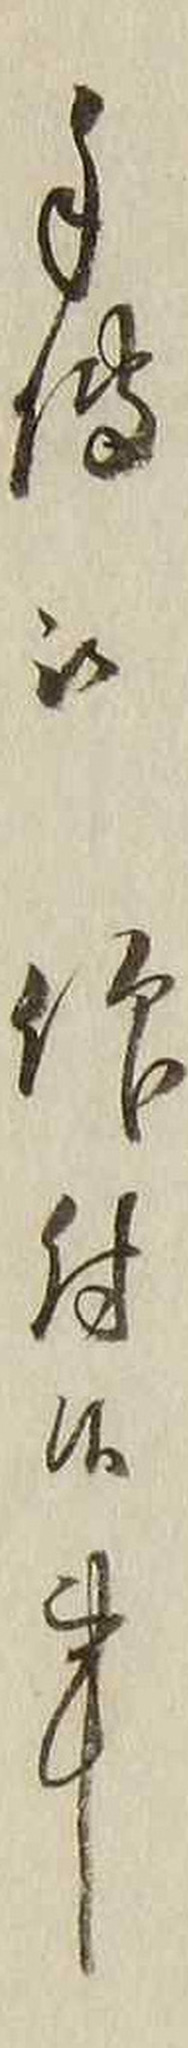手伝被仰付候事
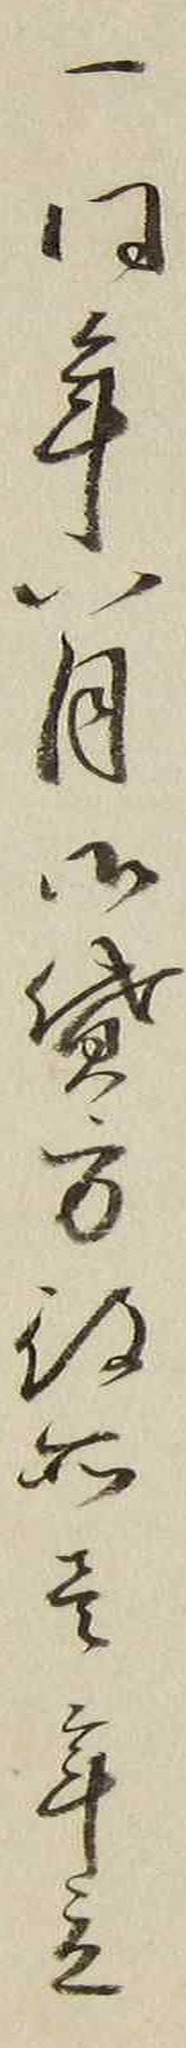一同年八月御貸方役所壱年立
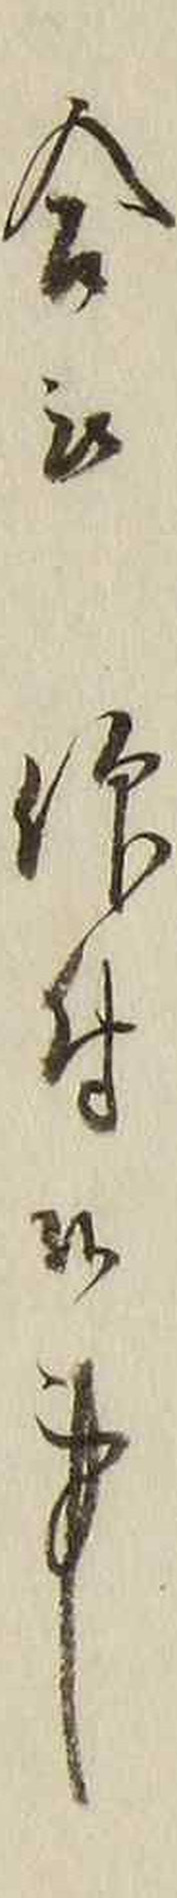合被仰付候事

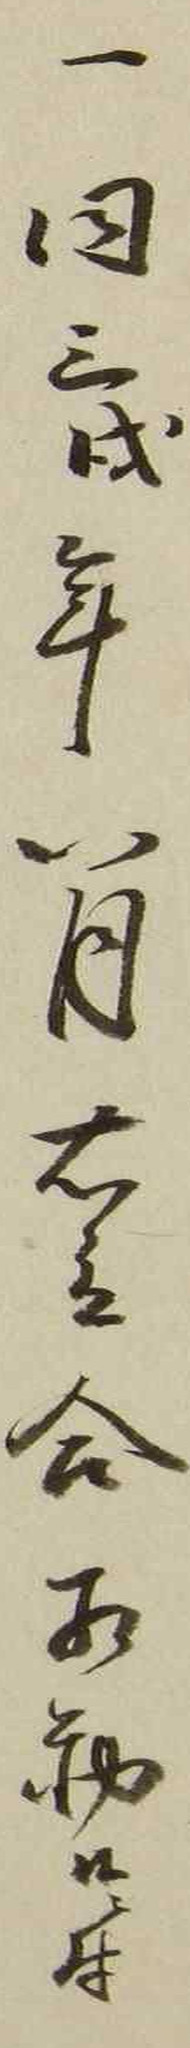一同三戌年八月右立合相勤候ニ付
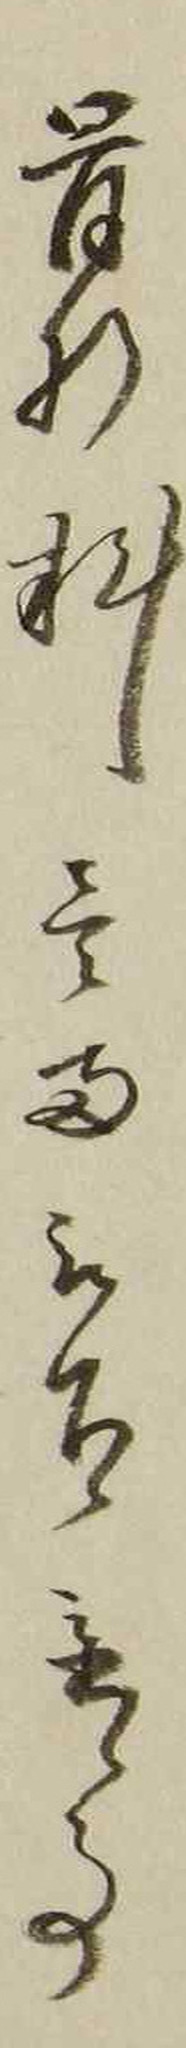骨折料壱両被下置候事
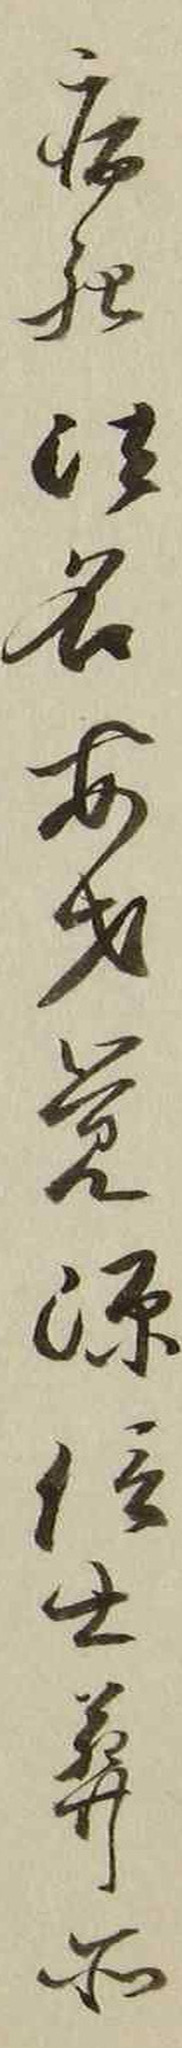病死法名安才覚源信士葬所
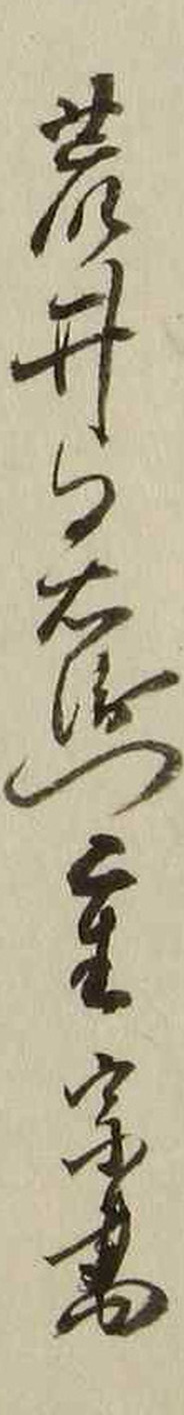女荒井与右衛門重宗妻
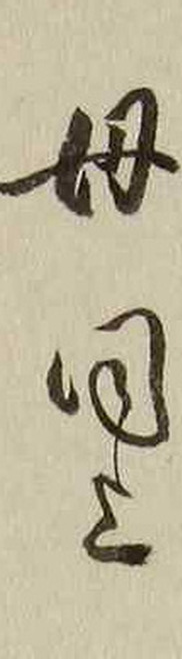母同上
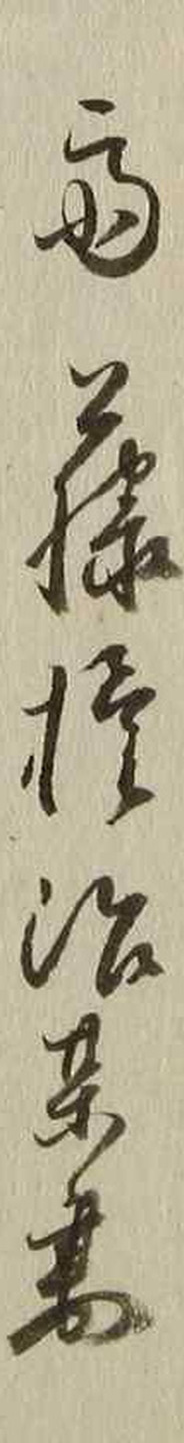女高藤権治某妻
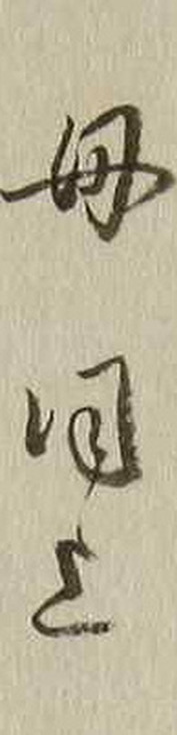母同上
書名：諸士系譜　巻之52　に之部3
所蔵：会津若松市立会津図書館
